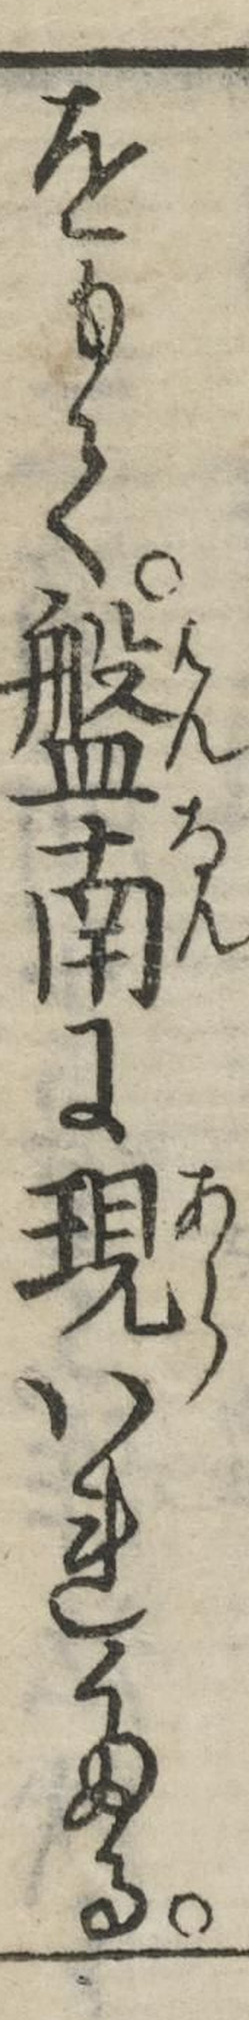をもて。盤南に現はれたる。
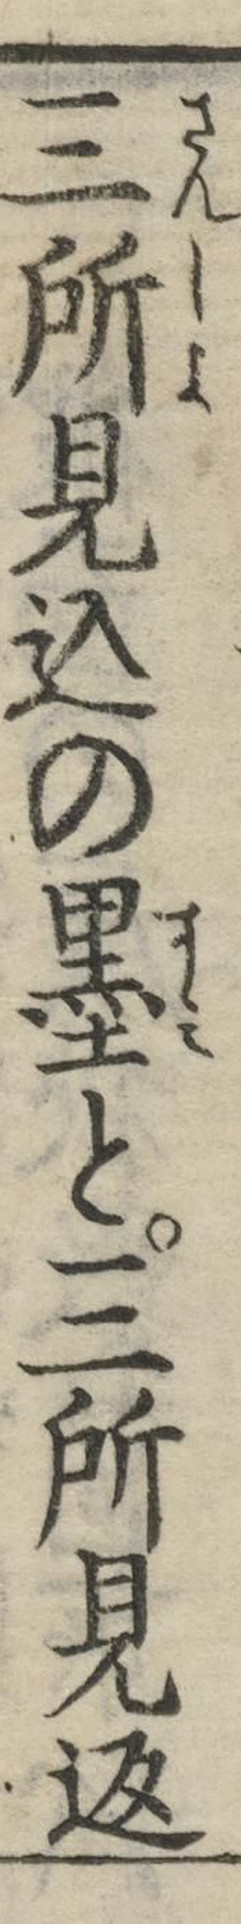三所見込の墨と。三所見返
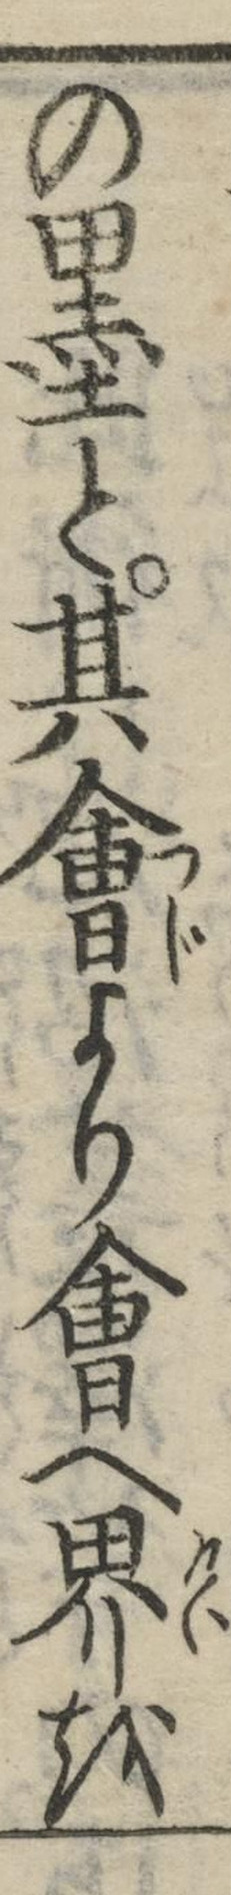の墨と。其会より会へ界を
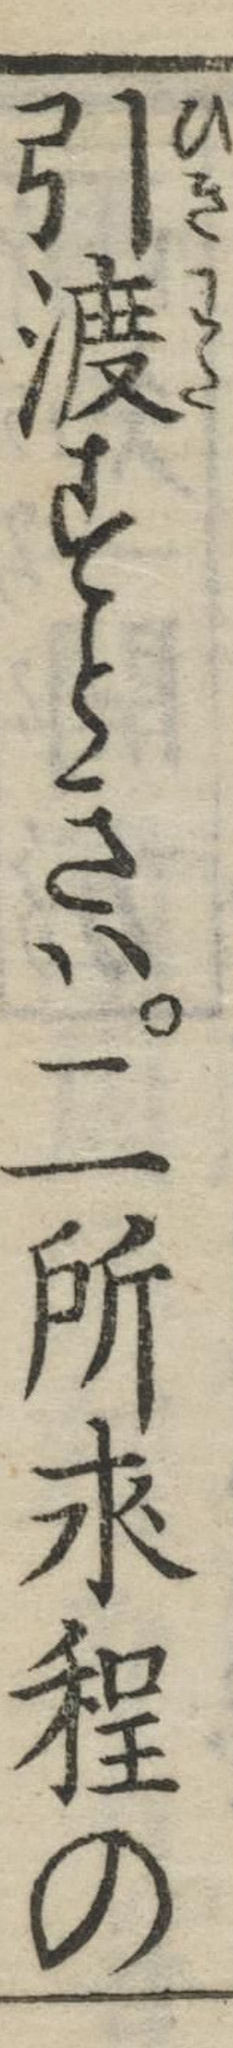引渡すときは。二所求程の
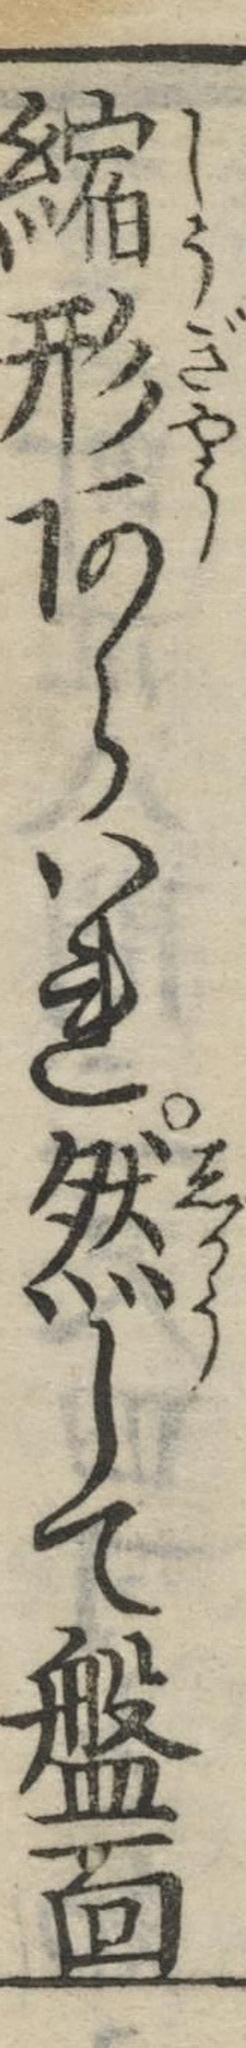縮形あらはれ。然して盤面
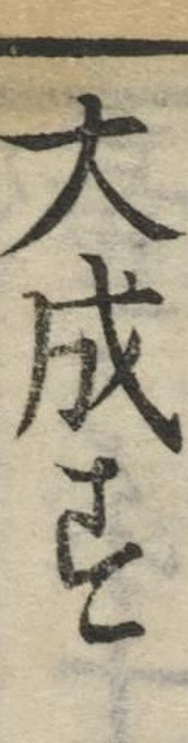大成す
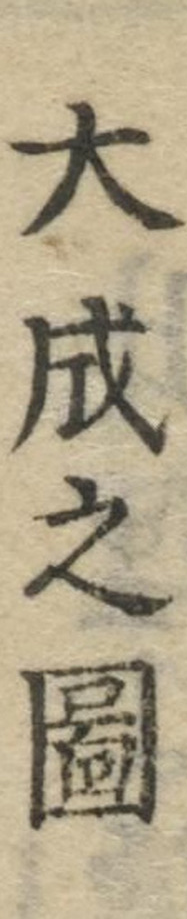大成之図
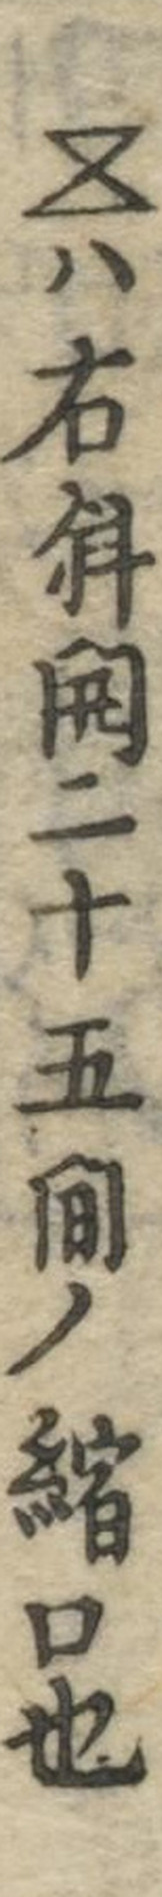▽△ハ右斜開二十五間ノ縮口也
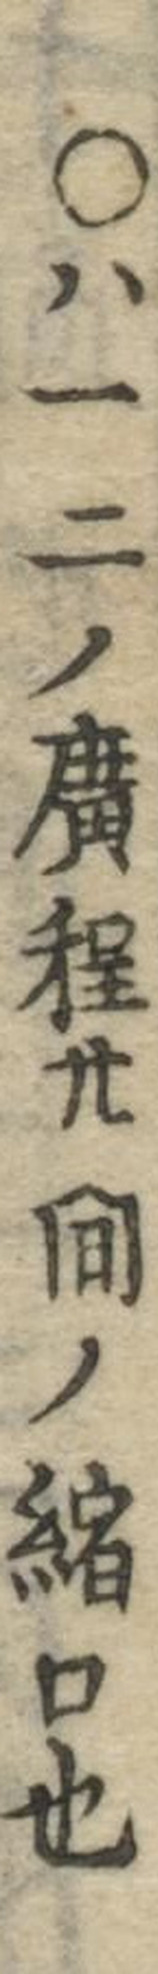○ハ一二ノ広程廿間ノ縮口也
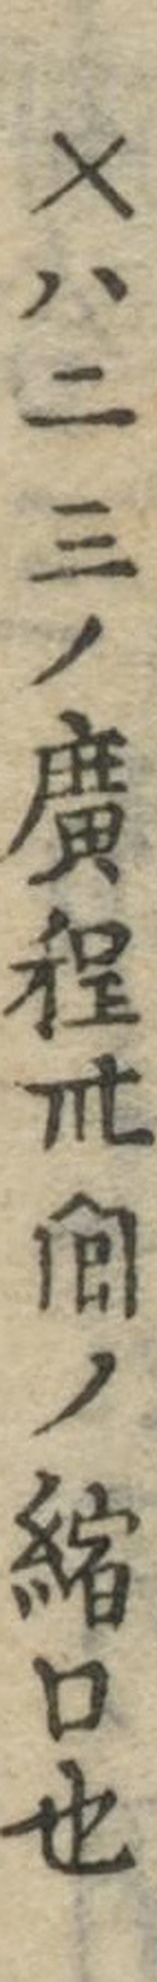✕ハ二三ノ広程丗間ノ縮口也
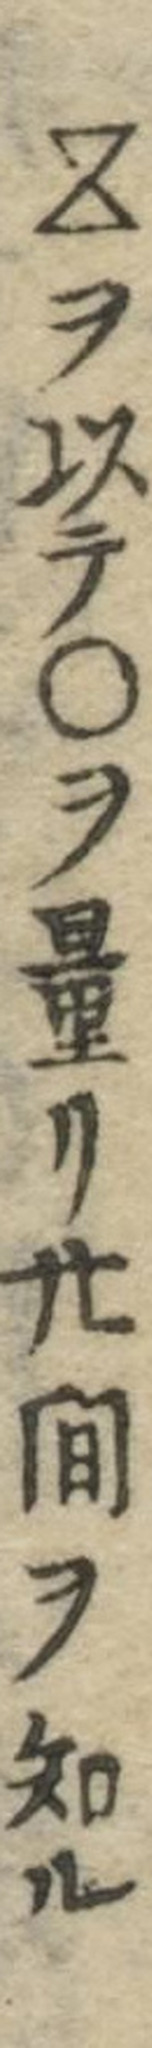▽△ヲ以テ○ヲ量リ廿間ヲ知ル
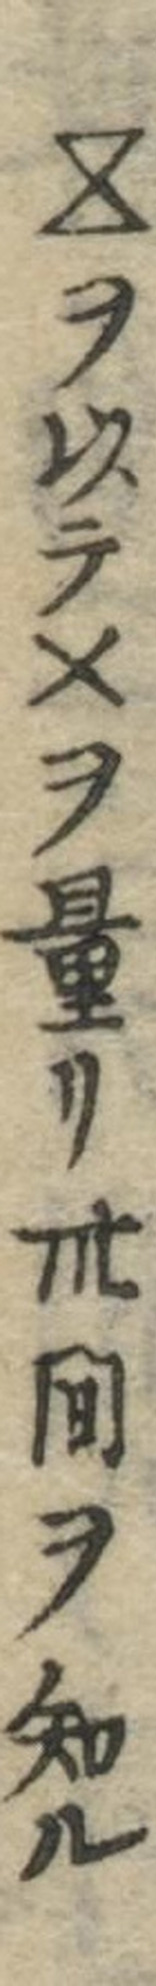▽△ヲ以テ○ヲ量リ廿間ヲ知ル
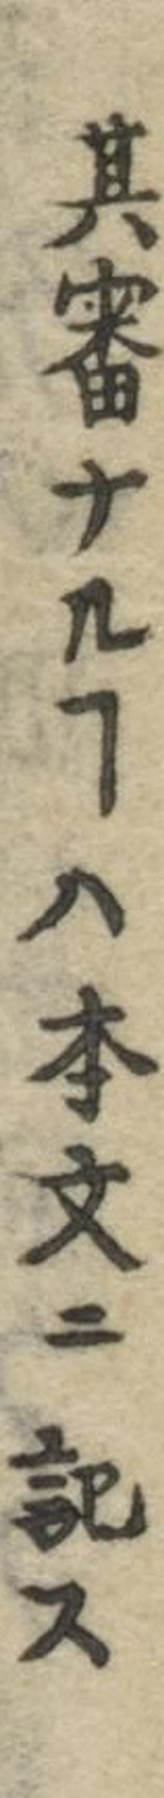其審ナルコトハ本文ニ記ス

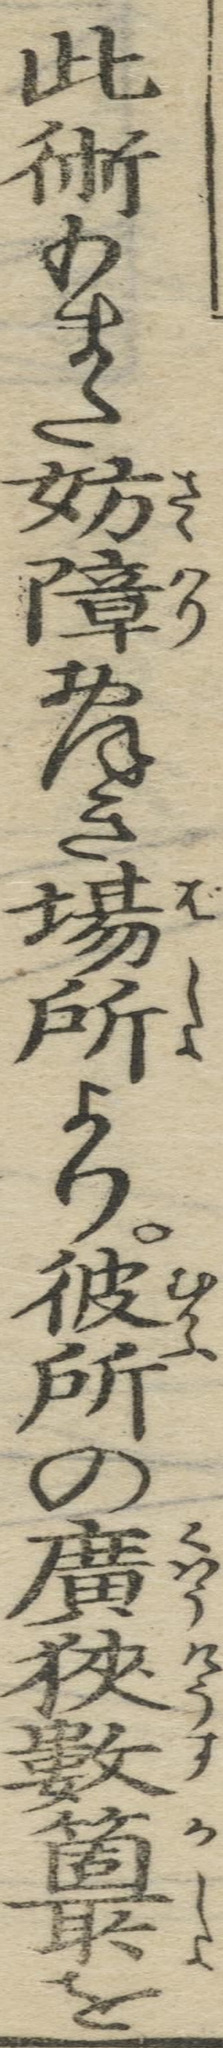此術もまた妨障おほき場所より。彼所の広狭数箇所を
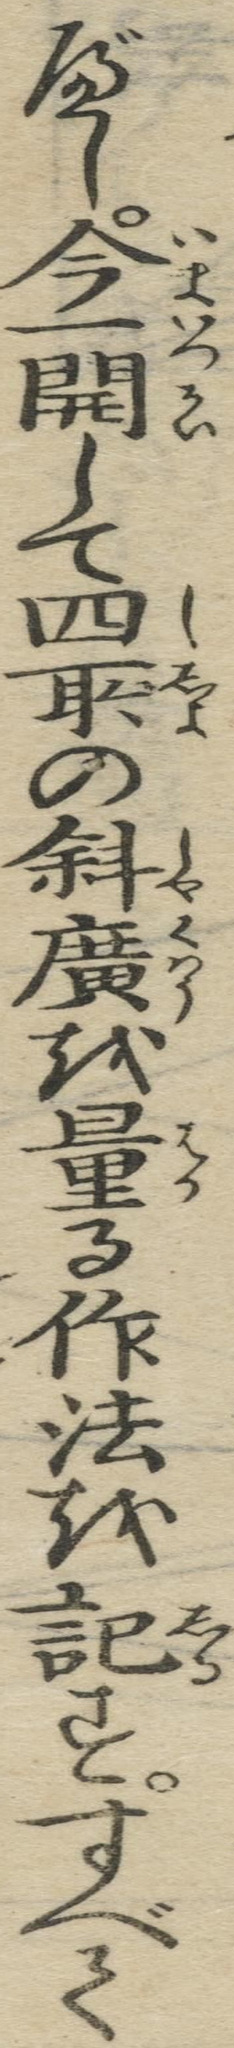べし。今一開して四所の斜広を量る作法を記す。すべて
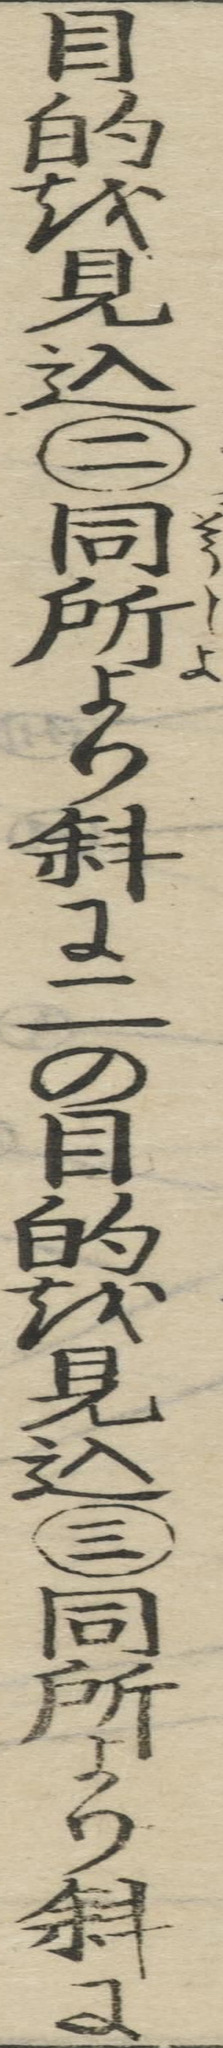目的を見込㊁同所より斜に二の目的を見込㊂同所より斜に
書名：量地指南　巻之三（内題）
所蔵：東京大学地震研究所図書室 Earthquake Research Institute Library, The University of Tokyo, JAPAN
